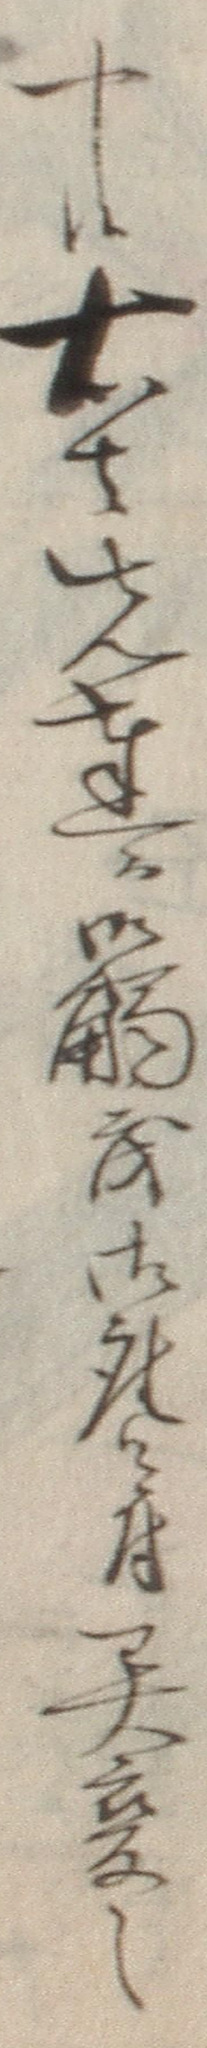申候右は先達而御触も御座候ニ付異変之
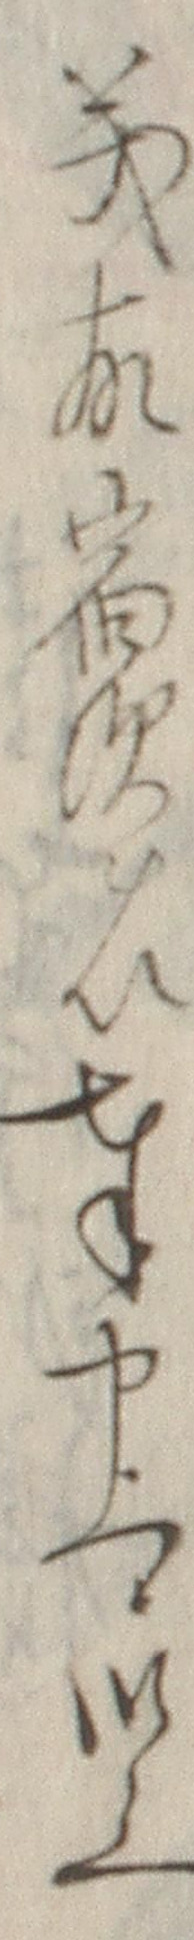義故宿便ヲ以奉申上候以上
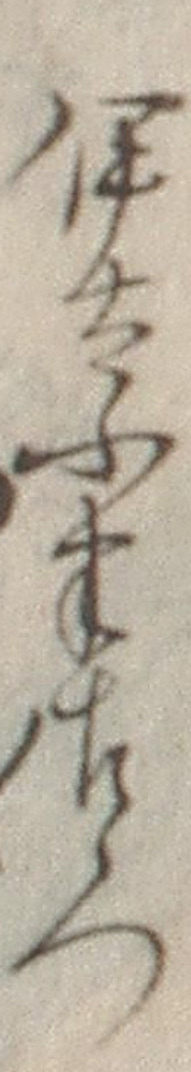伊奈半左衛門
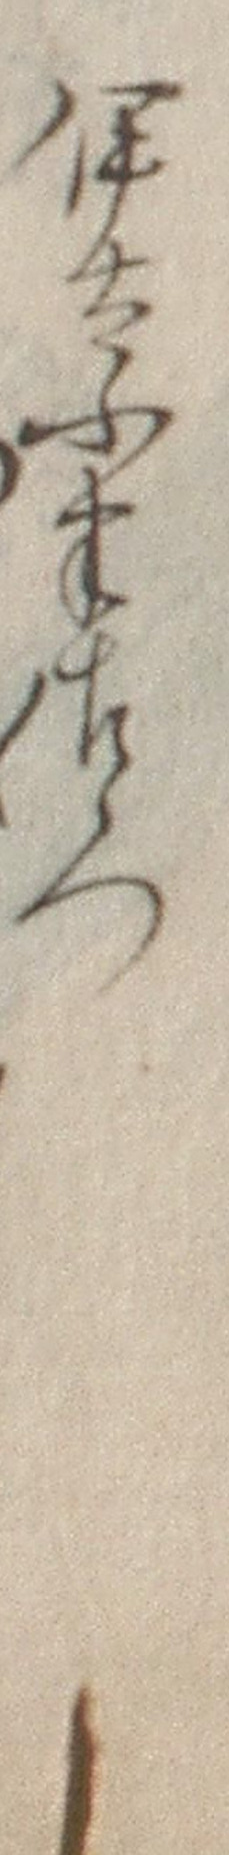伊奈半左衛門
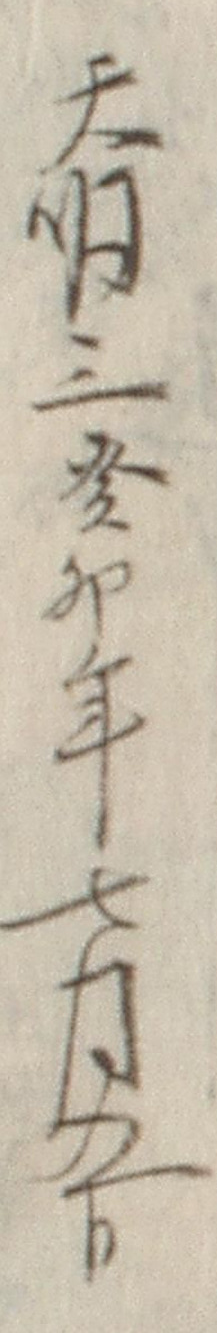天明三癸卯年七月九日
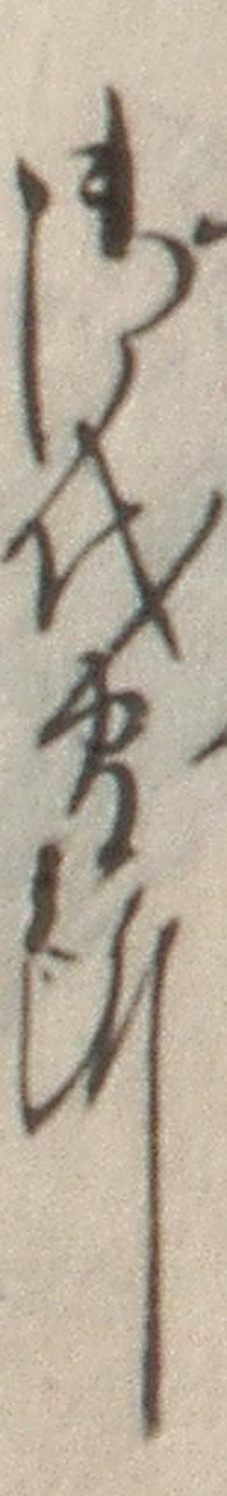御代官所
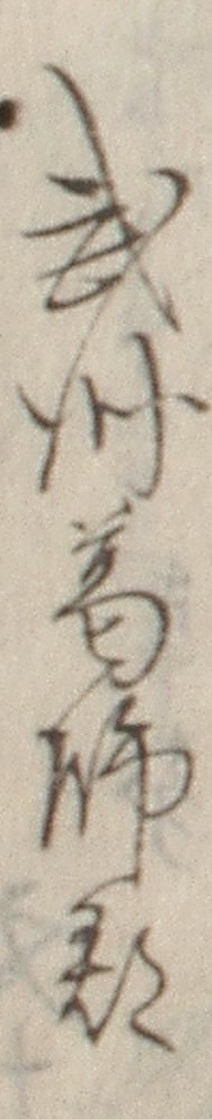武州葛飾郡
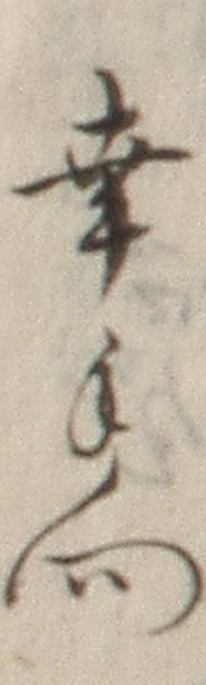幸手向

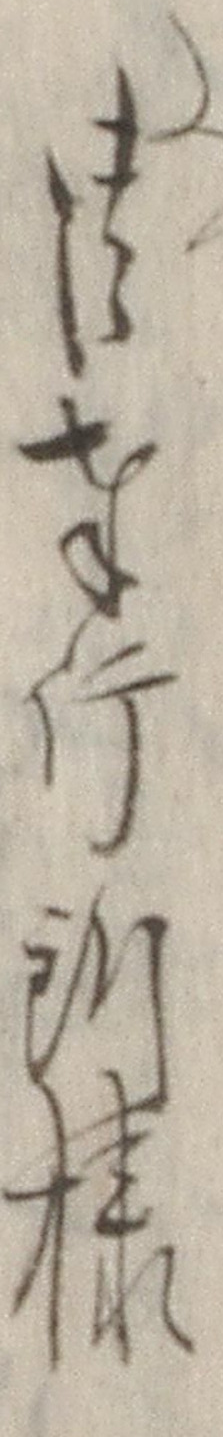御奉行所様
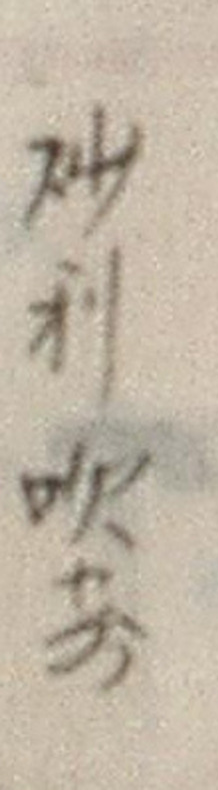砂利吹寄
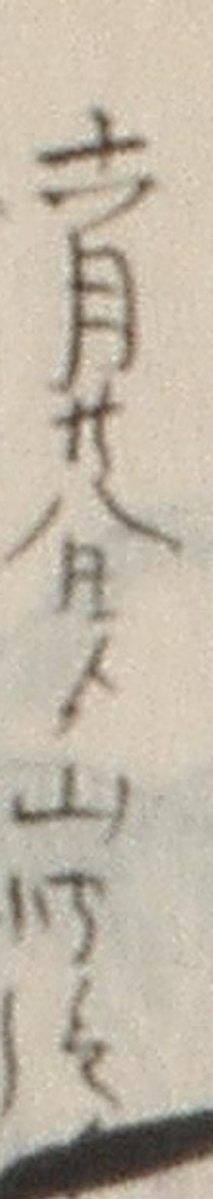六月廿八日ゟ山鳴強く
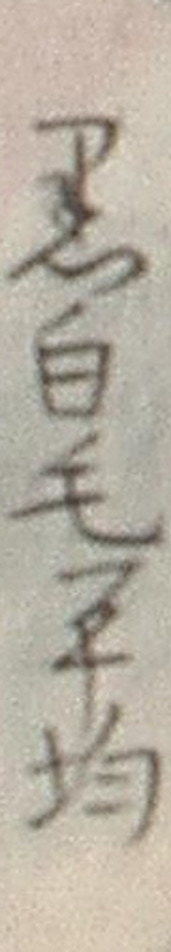黒白毛平均
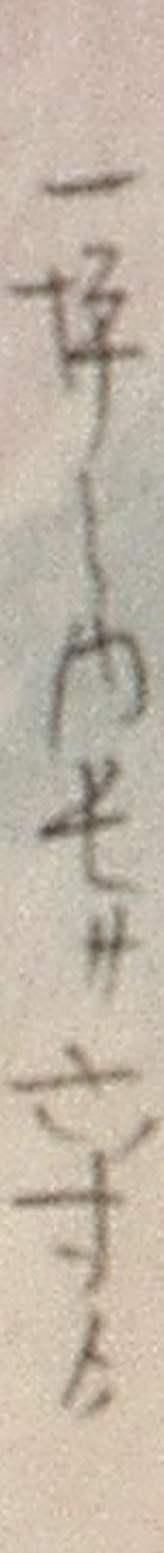一坪之内長サ六寸ゟ
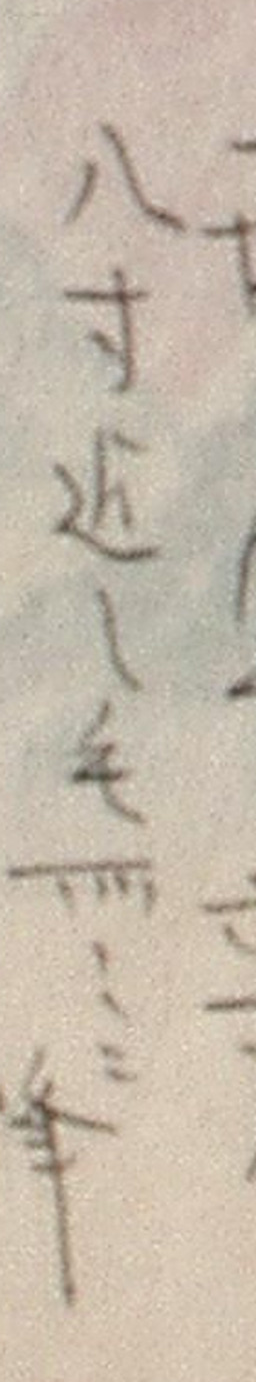八寸迄の毛所々ニ降
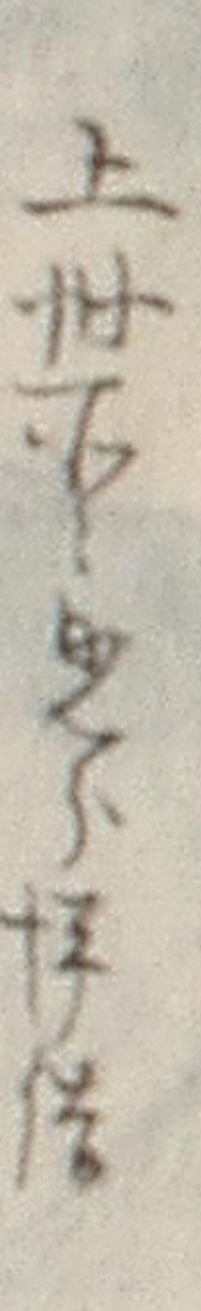上州所々忍分拝借
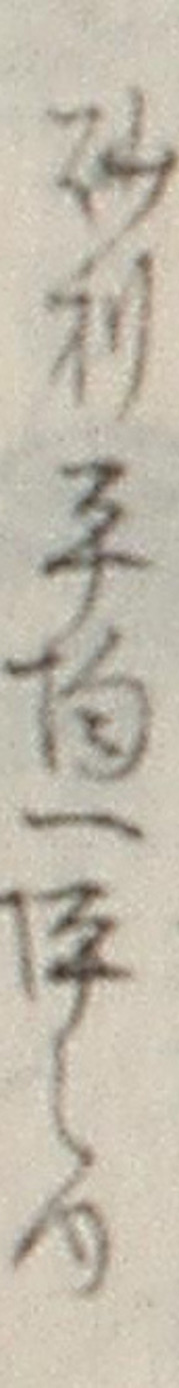砂利平均一坪の内
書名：[諸国災害記録]
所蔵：東京大学地震研究所図書室 Earthquake Research Institute Library, The University of Tokyo, JAPAN
